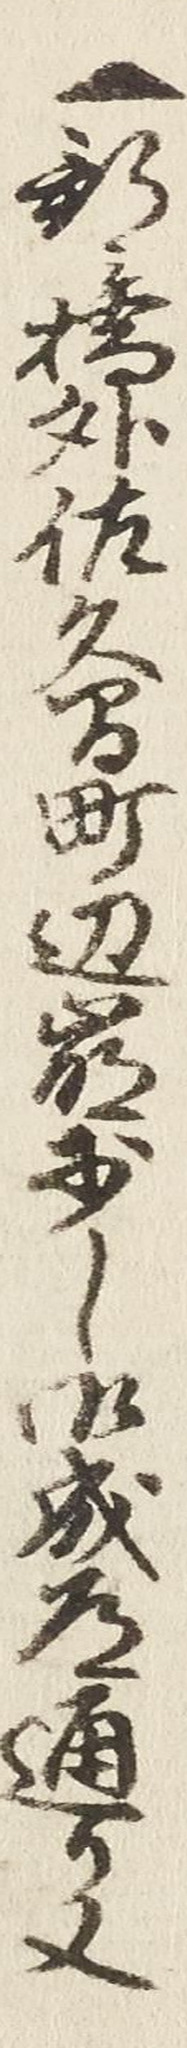▲新シ橋外佐久間町辺崩少し御成道通り又
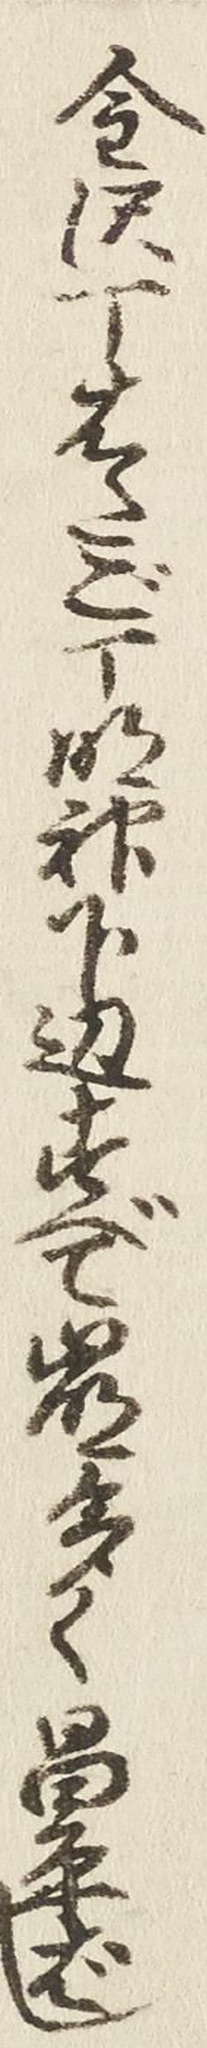金沢丁はたご丁明神下辺すべて崩多く昌平ばし
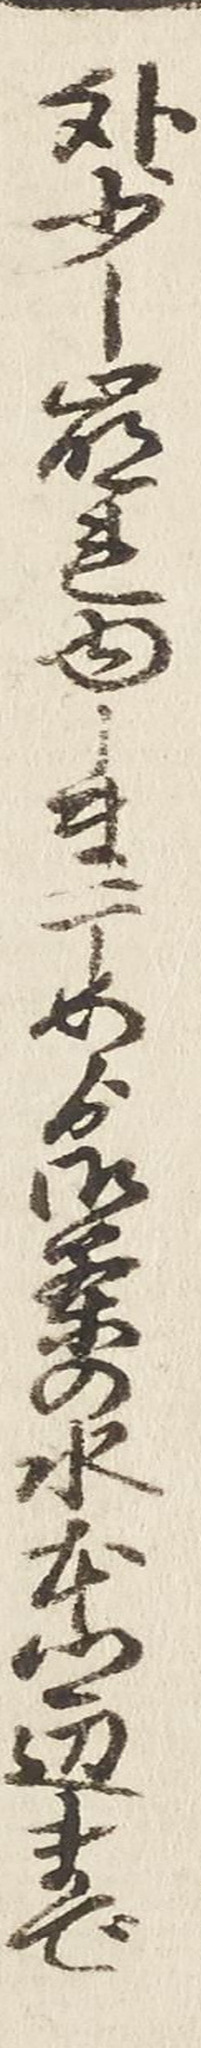外少し崩れゆしま一丁めゟ御茶の水本郷辺まで
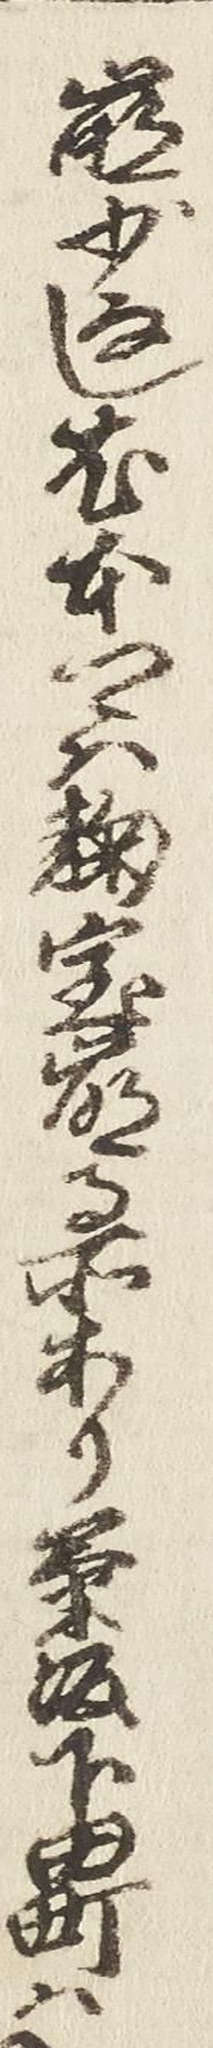崩少なし尤本郷は麹宝崩る所あり茶汲下田町は
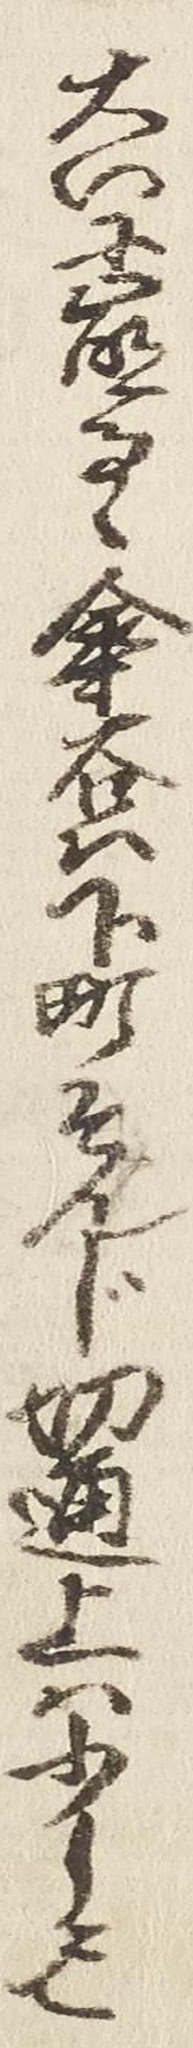大いに崩るゝ傘谷は下町そんじ切通上は少しニて
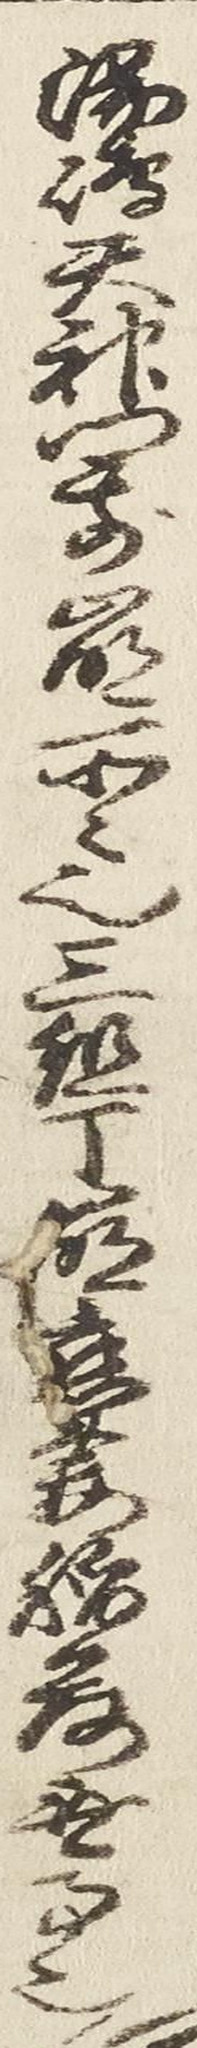湯嶋天神門前崩所々也三組丁崩恋妻稲荷無事也

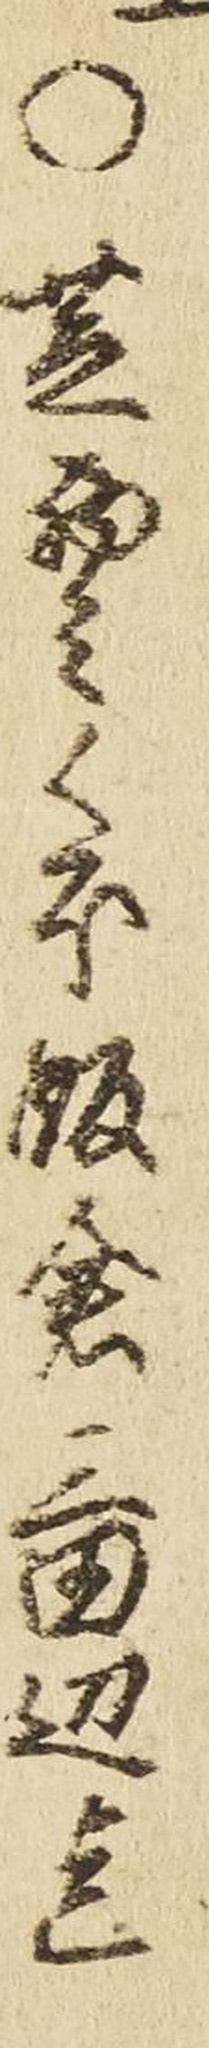○芝西之くほ飯倉三田辺迄
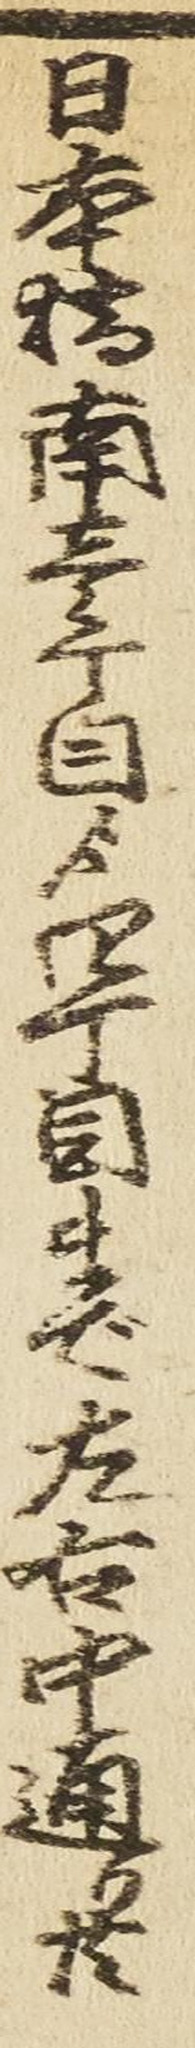日本橋南壱丁目ゟ四丁目まで左右中通り共
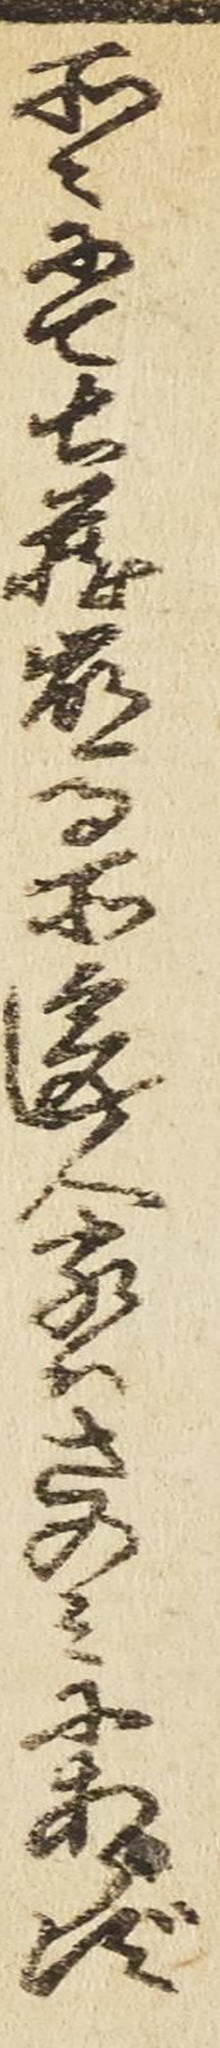所々にて土蔵崩る所多し人家はさのみにあらず
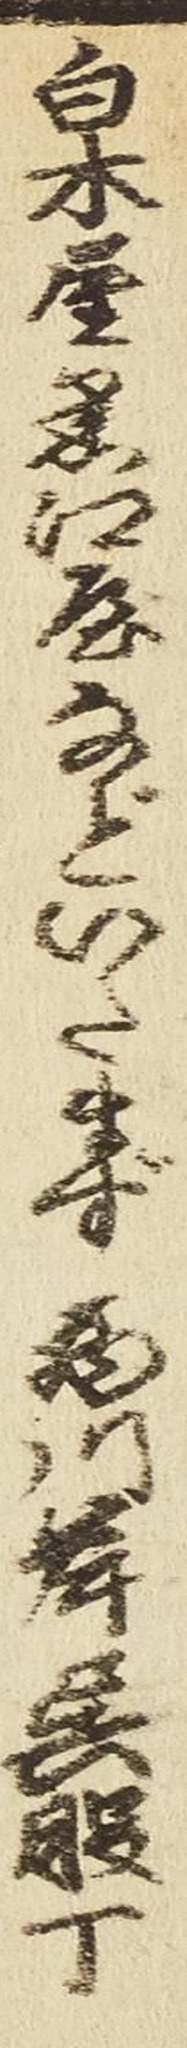白木屋黒江屋などいたまず西川岸呉服丁
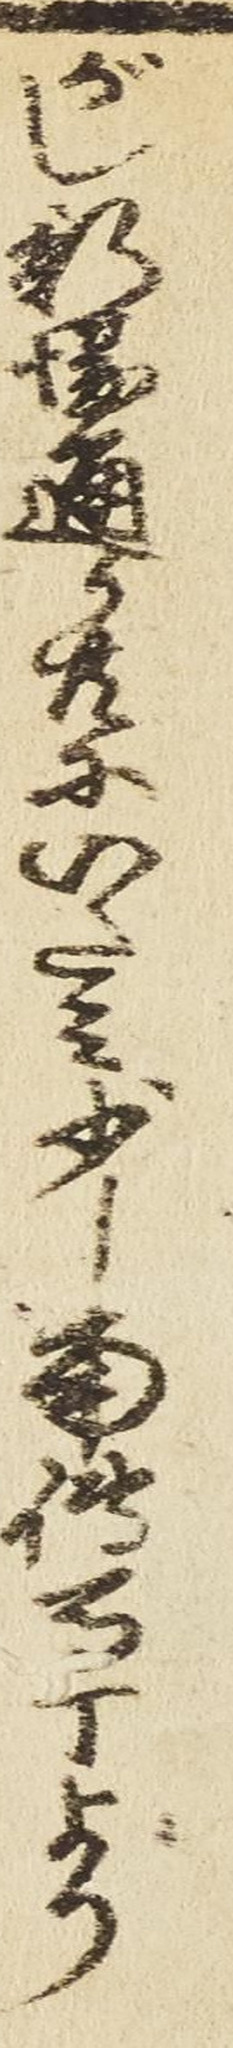がし新場通り共にいたみ少し南伝馬丁より
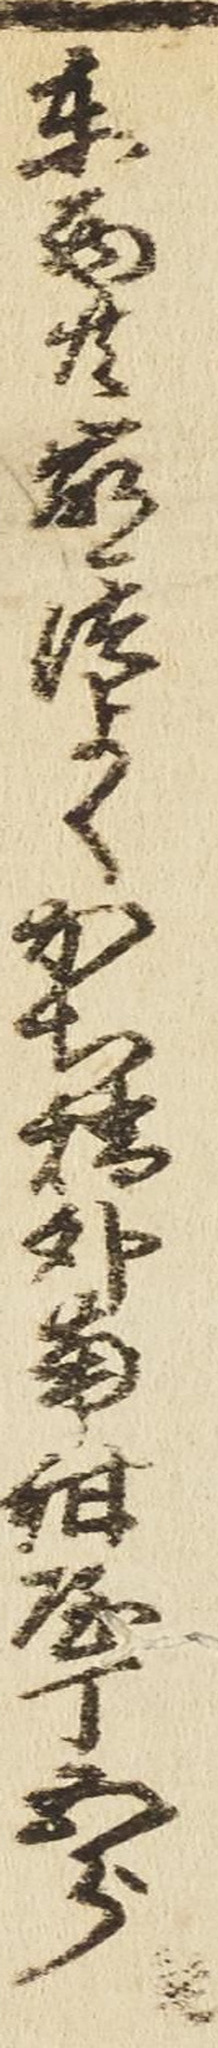東西共崩つよくかち橋外南紺屋丁五郎
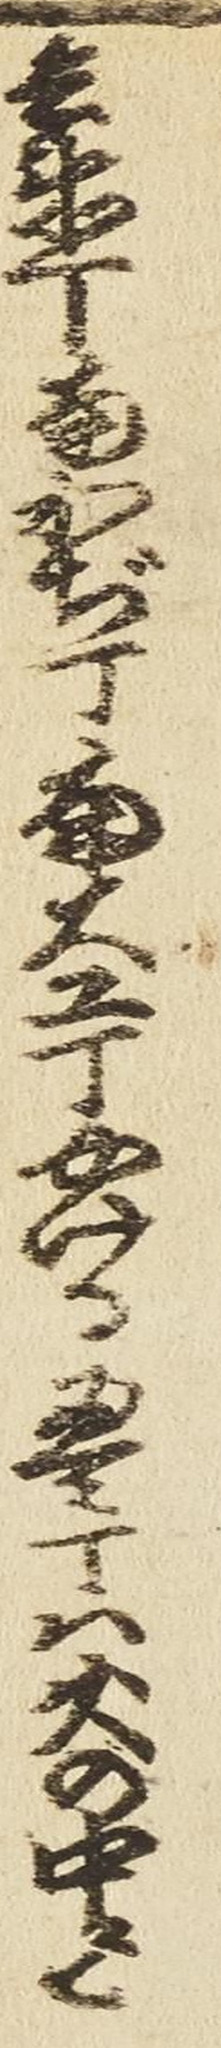兵衛丁南かぢ丁南大工丁やける畳丁は火の中ニて
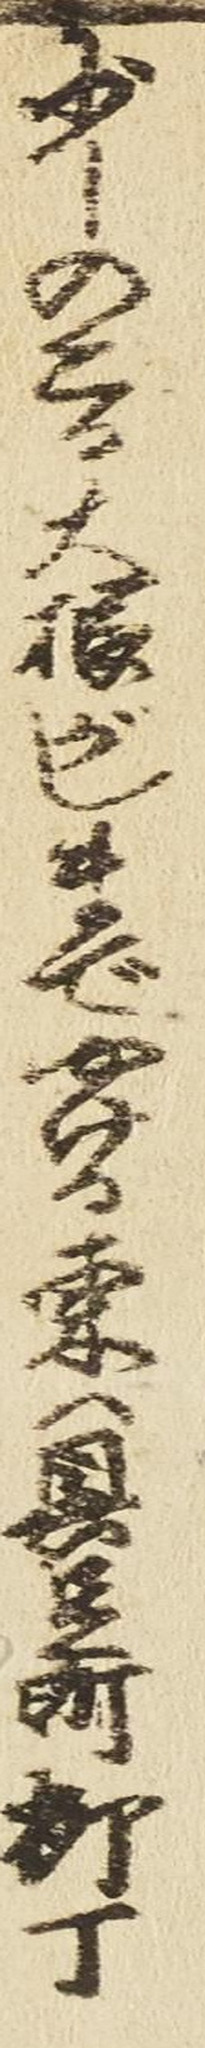少しのこる大振がしまでやける東は具足町柳丁
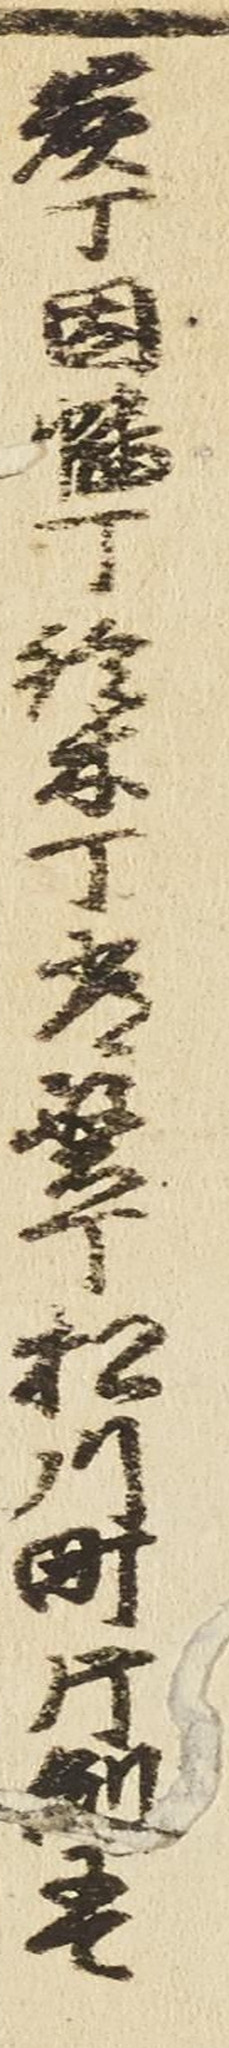炭丁因幡丁鈴木丁常盤丁松川町片側にて
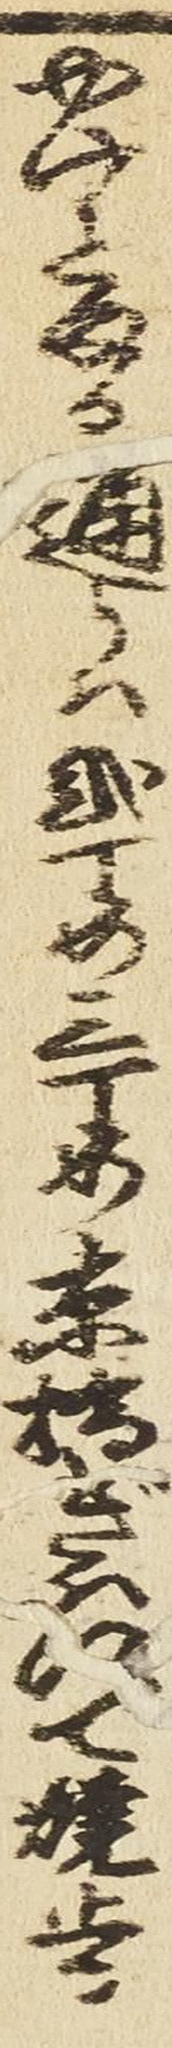やけてまる通りは弐丁め三丁め京橋ぎはにて焼止る
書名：江戸みやげ
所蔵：東京大学地震研究所図書室 Earthquake Research Institute Library, The University of Tokyo, JAPAN
